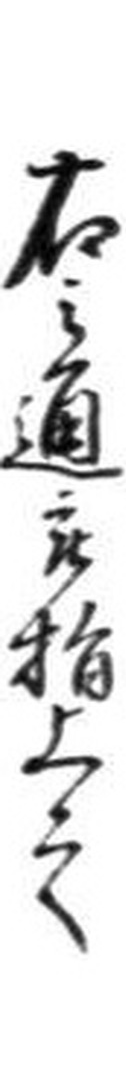右之通被指上之
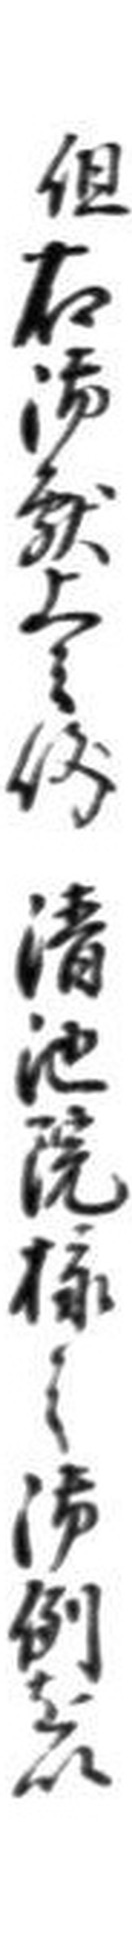但右御献上之儀清池院様之御例を以
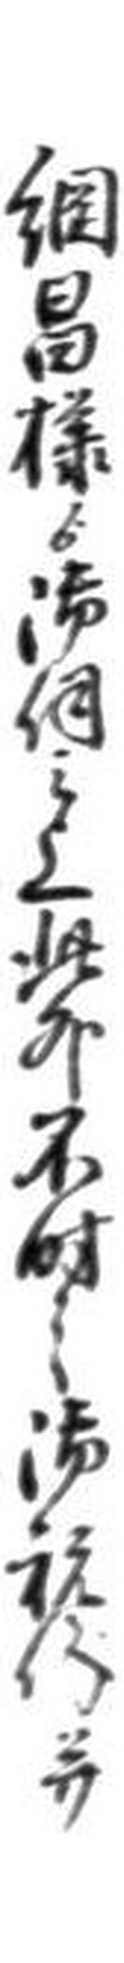綱昌様ゟ御伺之上此外不時之御祝儀并
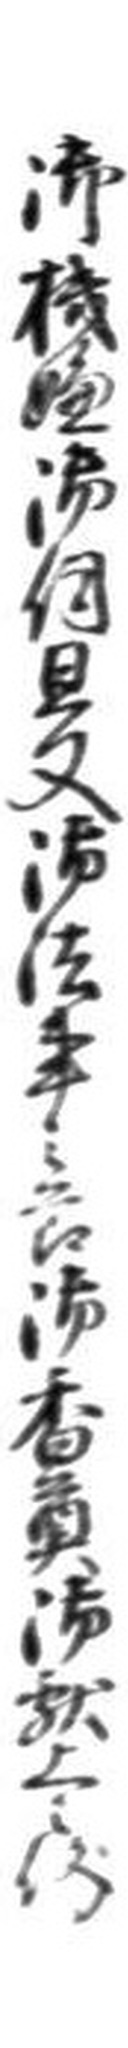御機嫌御伺且又御法事之節御香奠御献上之儀
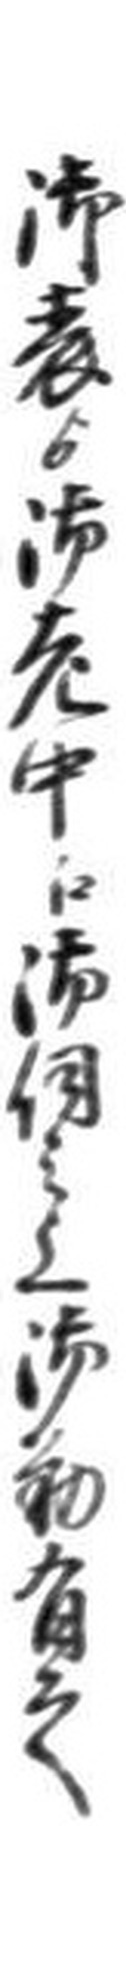御表ゟ御老中江御伺之上御勤有之

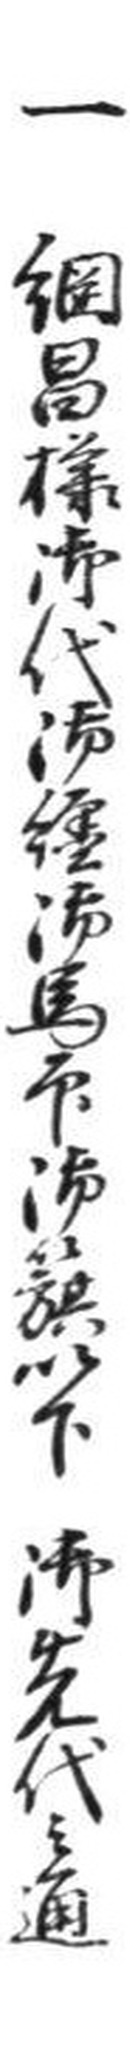一綱昌様御代御纏御馬印御籏以下御先代之通
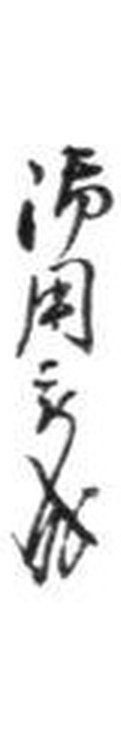御用被成
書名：家譜 十五 綱昌公 従天和元年到元禄十二年
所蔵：福井県文書館 Fukui Prefectural Archives
